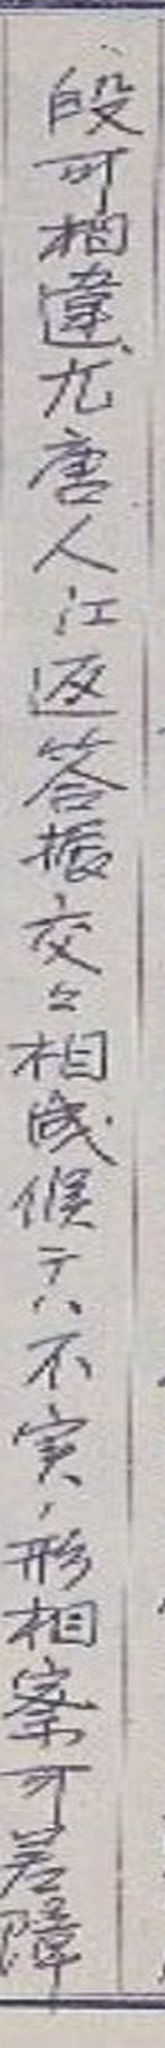段可相違尤唐人え返答振交々相成候ては不実の形相察可差障
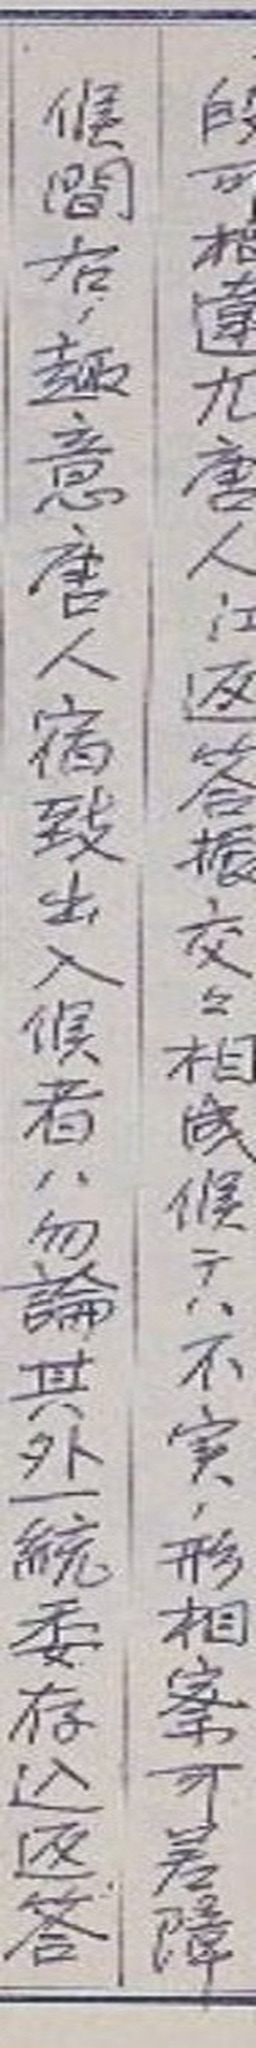候間右の趣意唐人宿致出入候者は勿論其外一統委存込返答
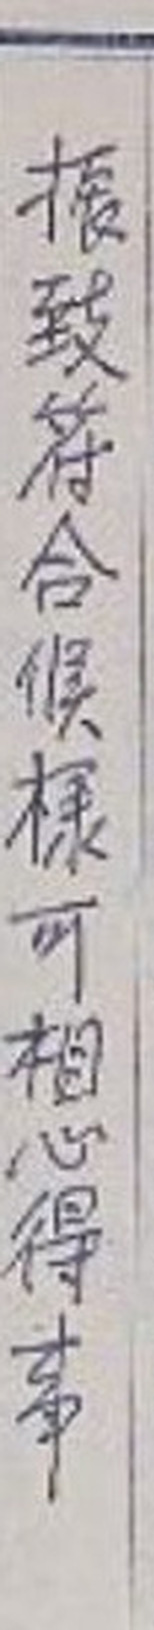振致符合候様可相心得事
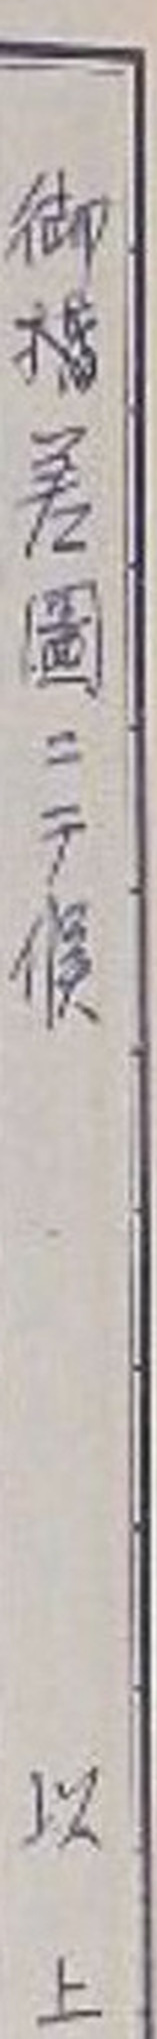御差図にて候以上
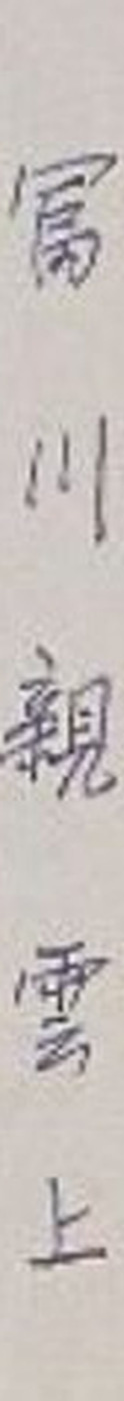冨川親雲上
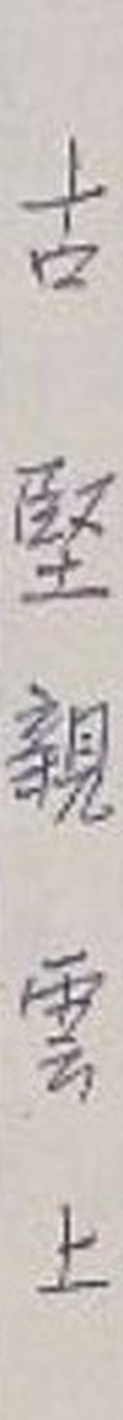古堅親雲上
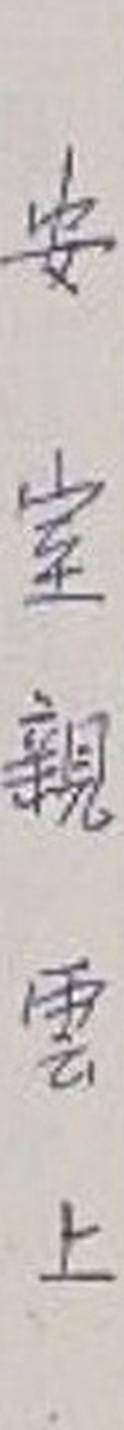安室親雲上
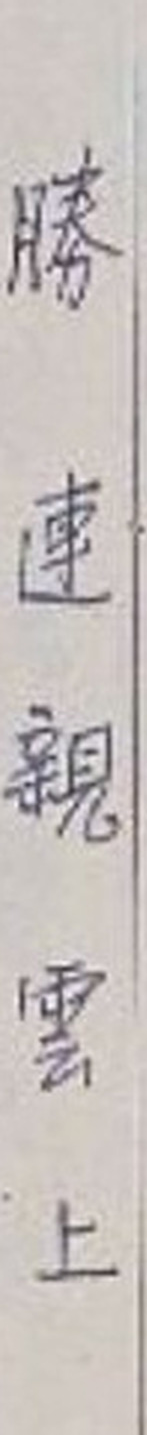勝連親雲上
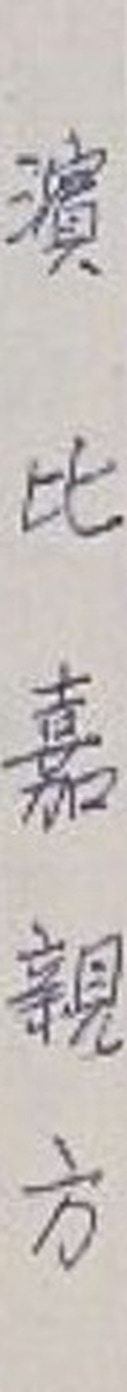浜比嘉親方
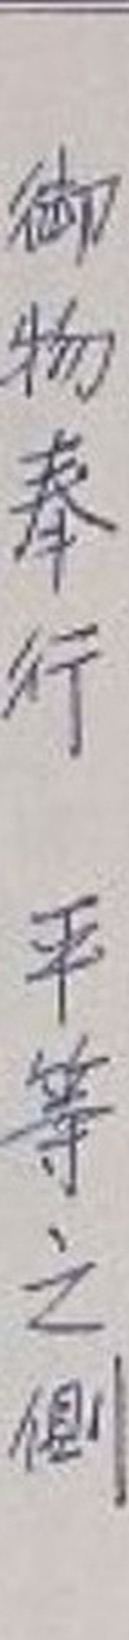御物奉行平等之側
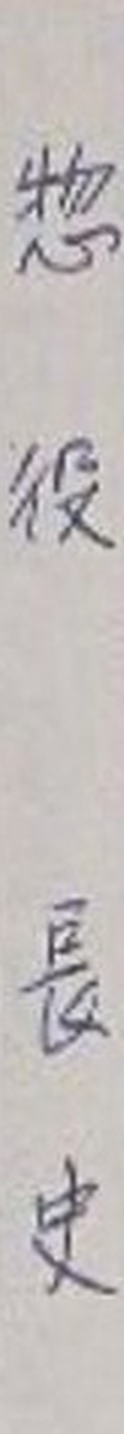惣役長史
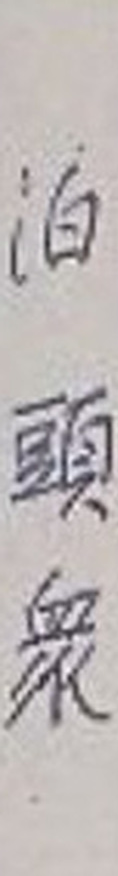泊頭衆
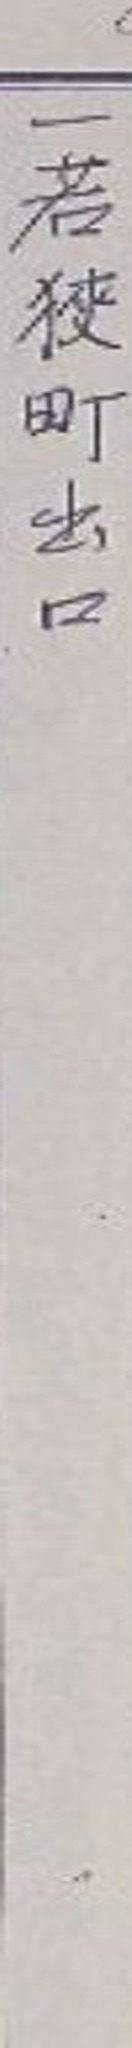一若狭町出口
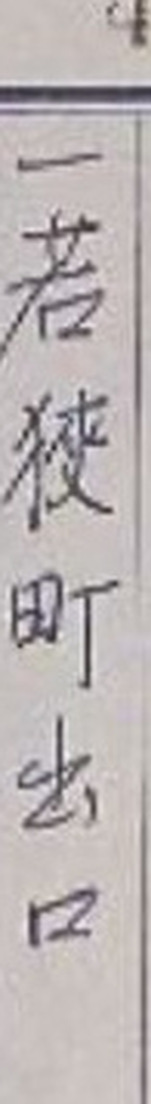一若狭町出口
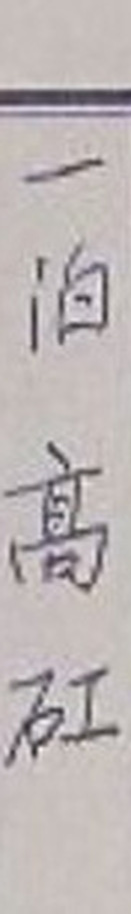一泊高矼
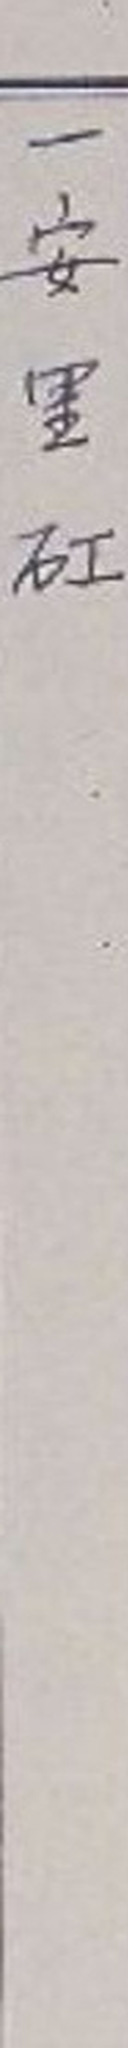一安里矼
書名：支那冊封使来琉諸記 下巻
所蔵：University of the Ryukyus Library
